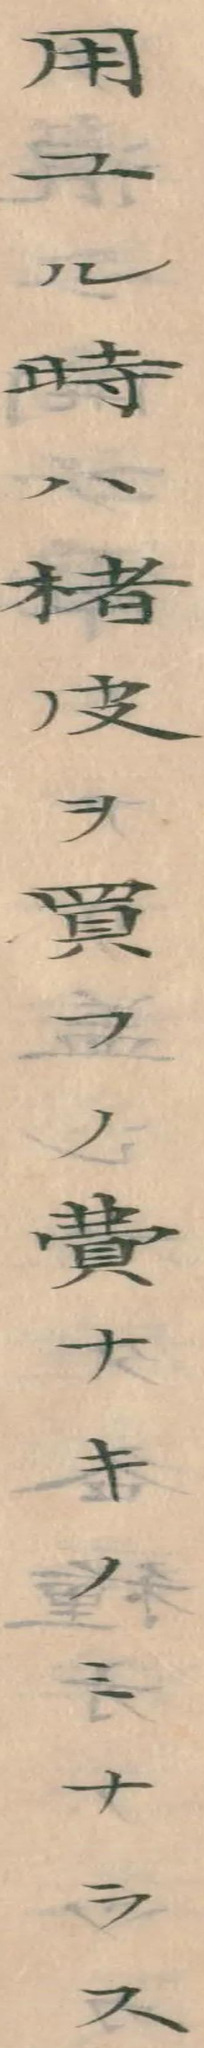用ユル時ハ楮皮ヲ買フノ費ナキノミナラス
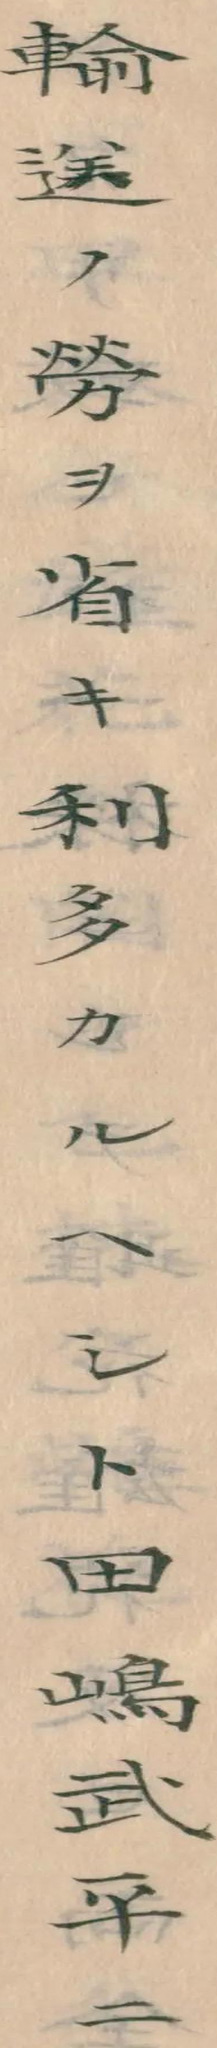輸送ノ労ヲ省キ利多カルヘシト田嶋武平ニ
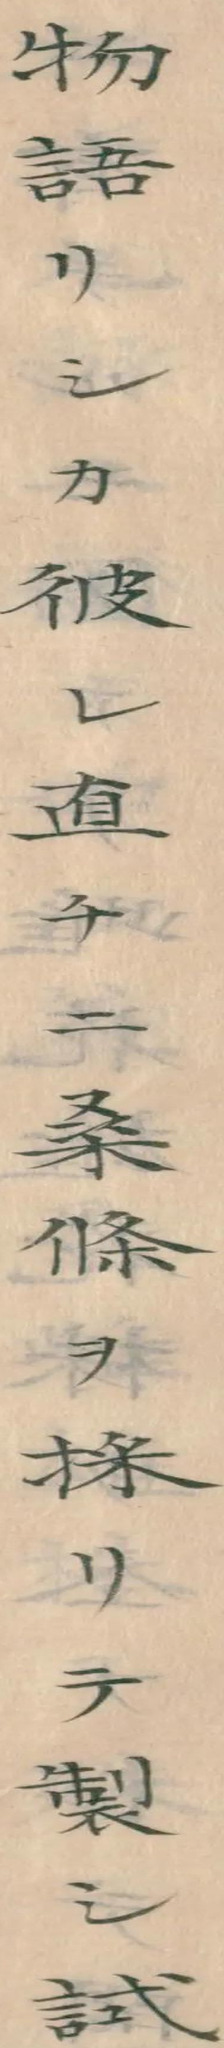物語リシカ彼レ直チニ桑条ヲ採リテ製シ試
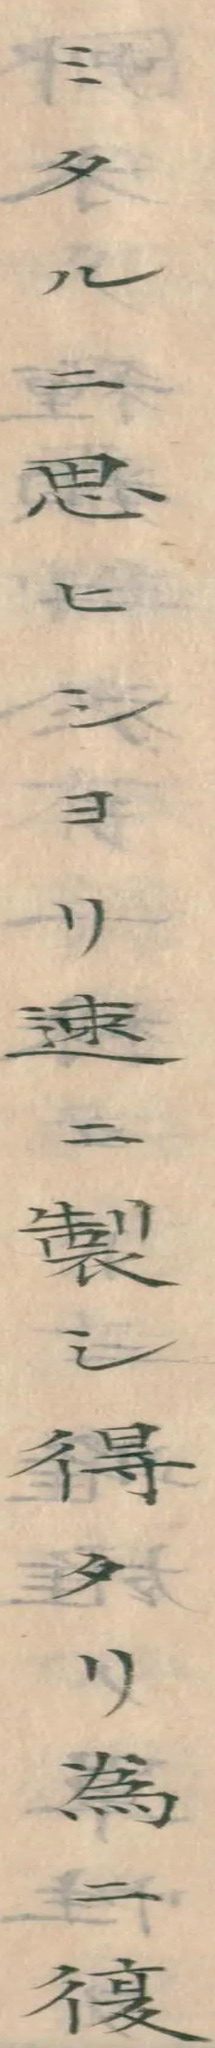ミタルニ思ヒシヨリ速ニ製シ得タリ為ニ復
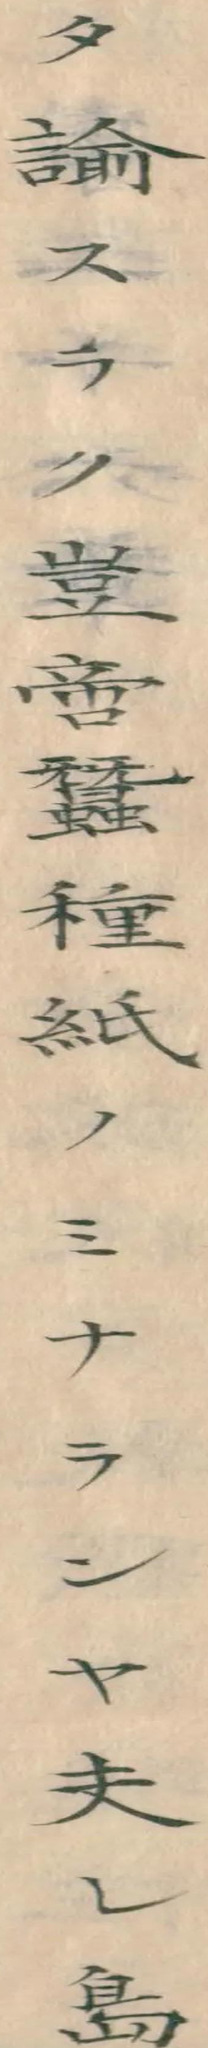タ諭スラク豈啻蚕種紙ノミナランヤ夫レ島
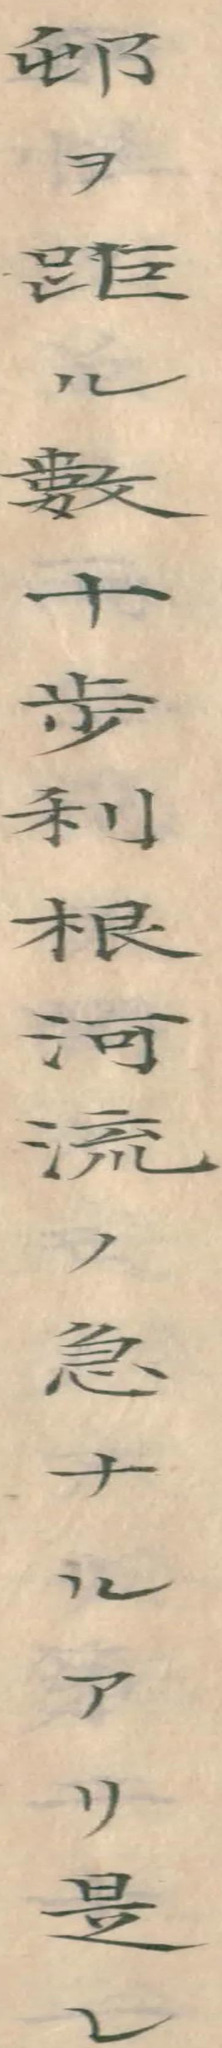邨ヲ距ル数十歩利根河流ノ急ナルアリ是レ
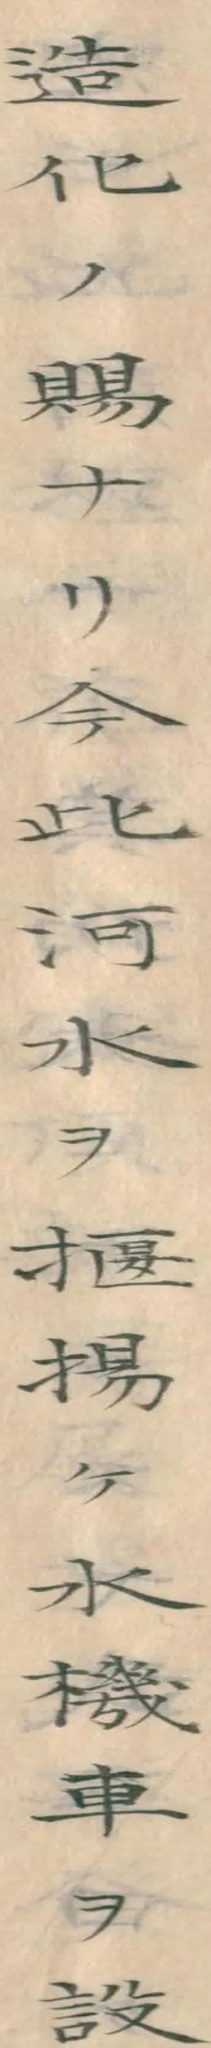造化ノ賜ナリ今此河水ヲ揠揚ケ水機車ヲ設
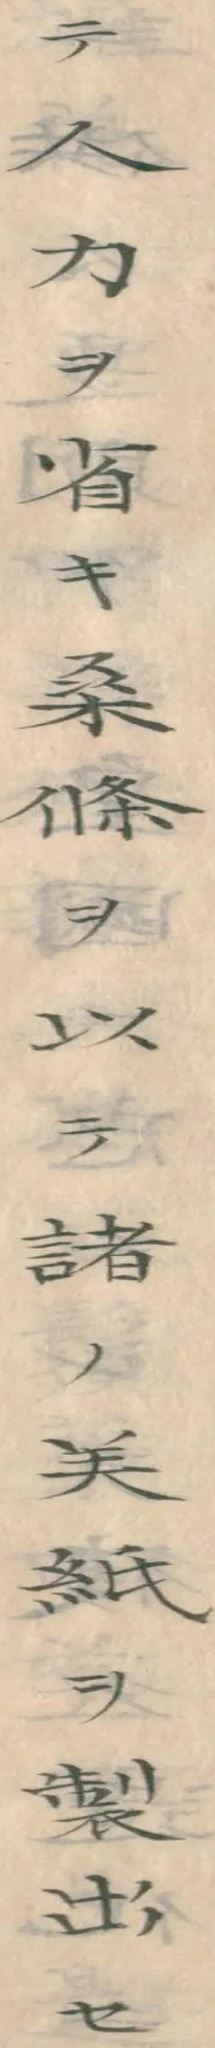テ人力ヲ省キ桑条ヲ以テ諸ノ美紙ヲ製出セ
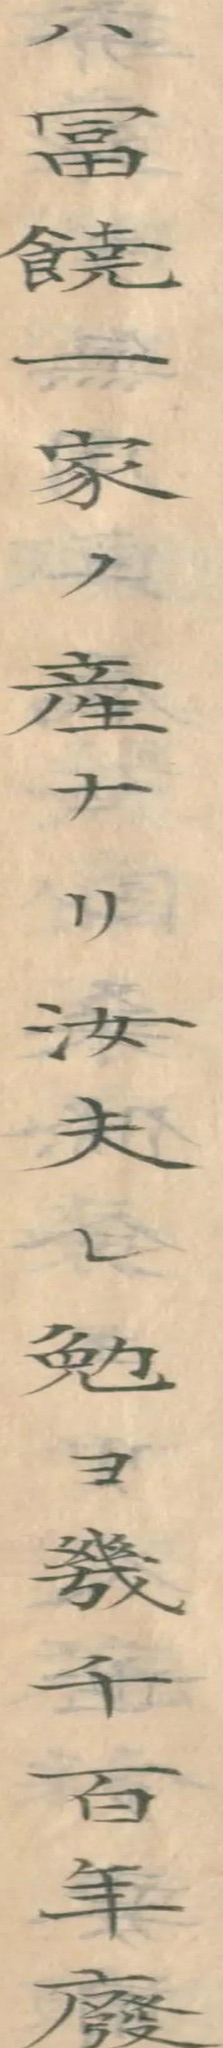ハ富饒一家ノ産ナリ汝夫レ勉ヨ幾千百年廃

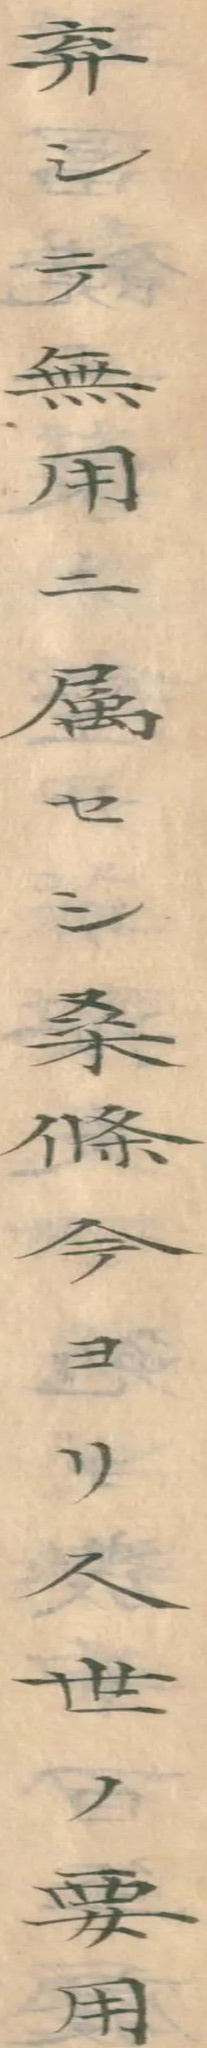棄シテ無用ニ属セシ桑条今ヨリ人世ノ要用
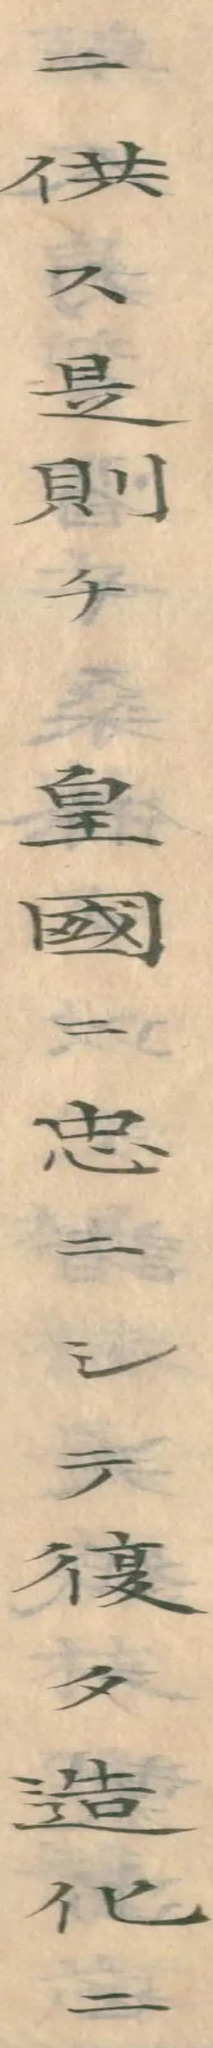ニ供ス是則チ皇国ニ忠ニシテ復タ造化ニ
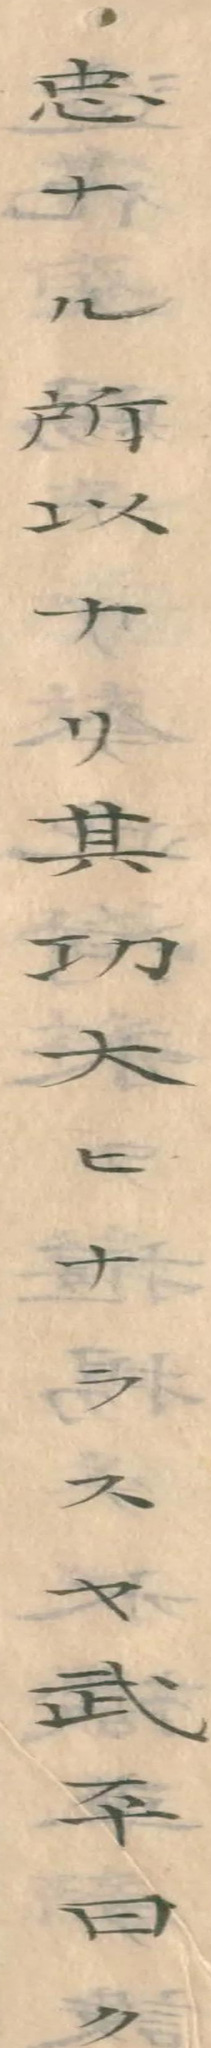忠ナル所以ナリ其功大ヒナラスヤ武平曰ク
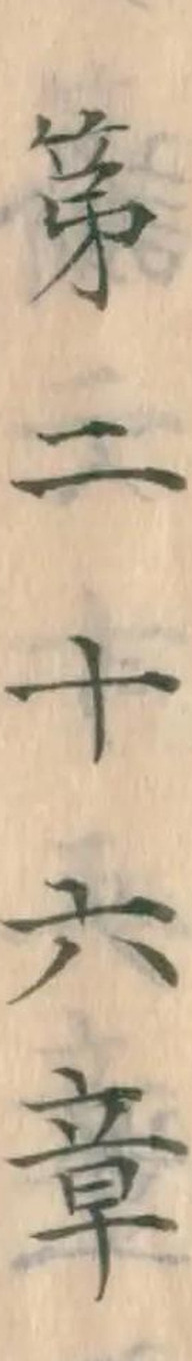第二十六章
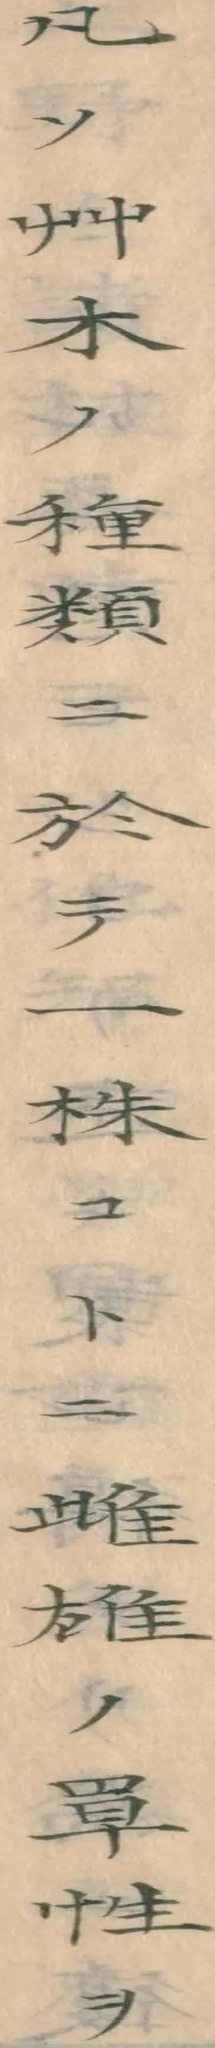凡ソ草木ノ種類ニ於テ一株コトニ雌雄ノ単性ヲ
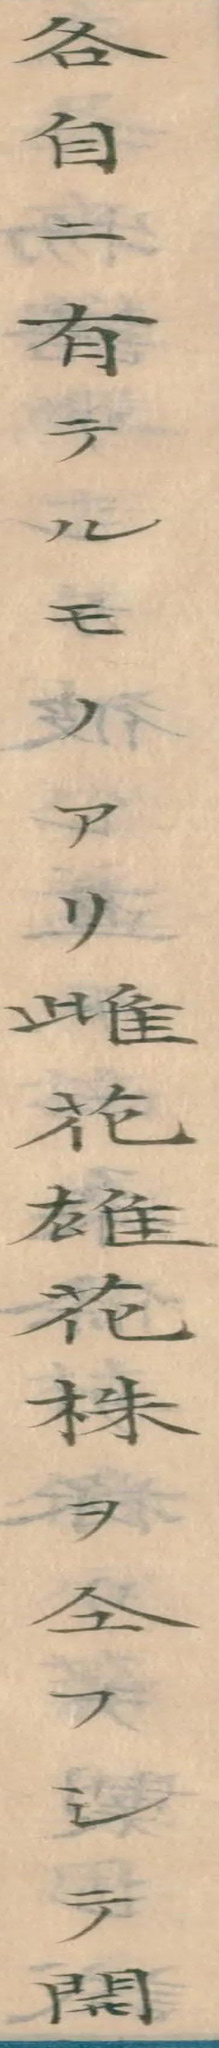各自ニ有テルモノアリ雌花雄花株ヲ仝フシテ開
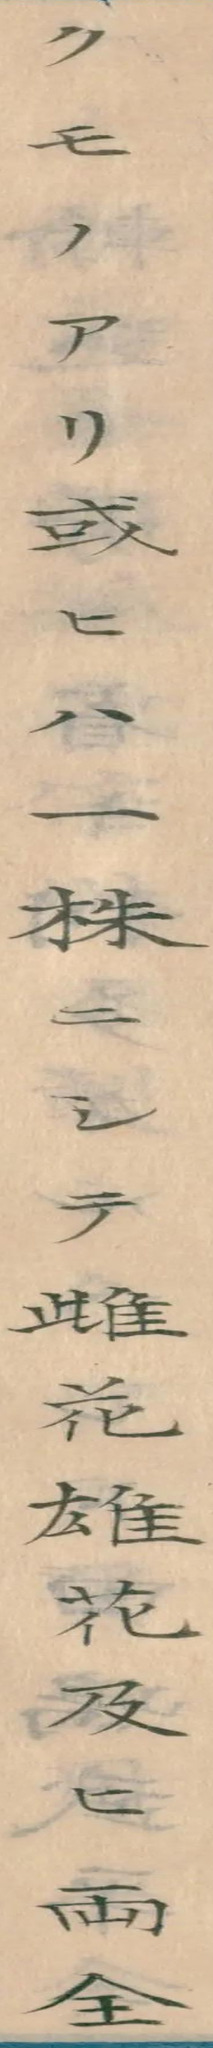クモノアリ或ヒハ一株ニシテ雌花雄花及ヒ両全
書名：蚕桑集成
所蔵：国立国会図書館 National Diet Library, JAPAN
